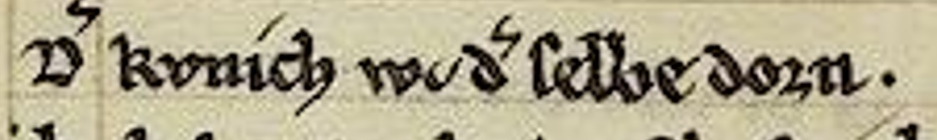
D(er) kvnich w(az) d(er) ſelbe dorn.
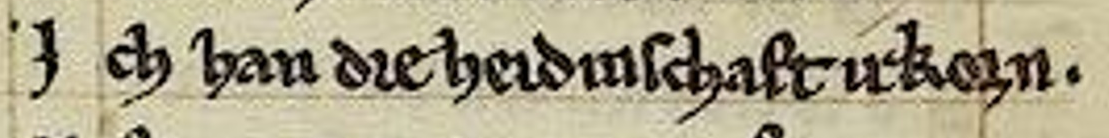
Ich han die heindinchaft irkorn.
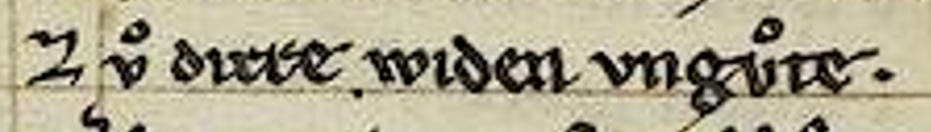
Zv°o dirre widen vngv°ote.
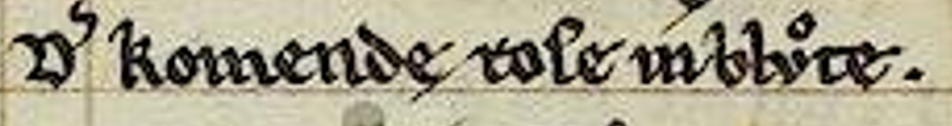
D(er) komende roſe in blv°ote.
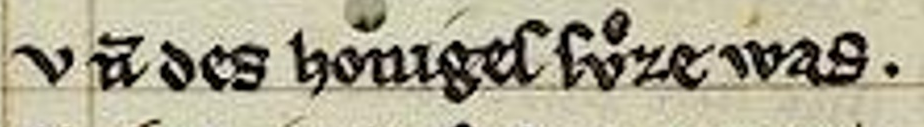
Vn(d) des honigeſ ſv°oze was.
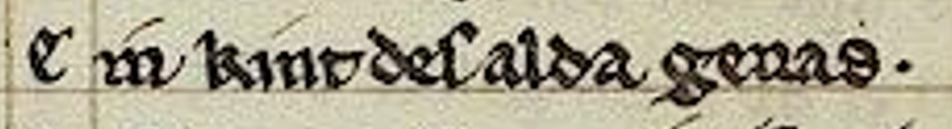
Ein kint deſ alda genas.
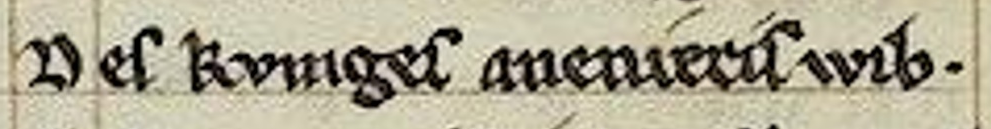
Deſ kvnigeſ auenieriſ wib.
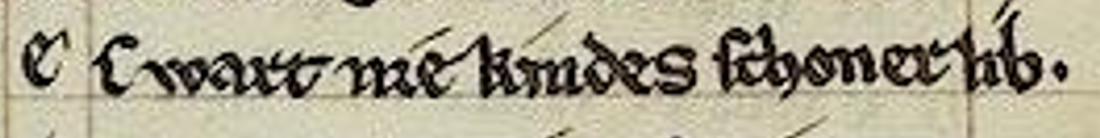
Eſ wart nie kindeſ ſchoner lib.
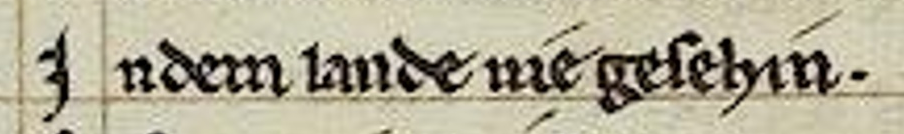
Indem lande nie geſehin.
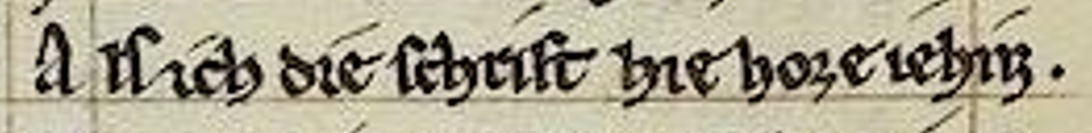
Alſ ich die ſchrift hie hore iehi?.
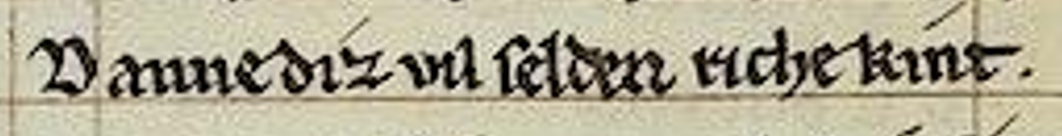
Danne diz vil ſelden riche kint.
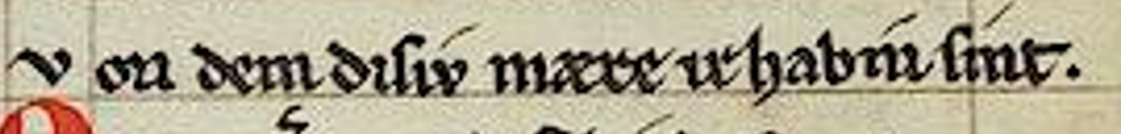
Von dem diſiv m[ae]re irhabin ſint.
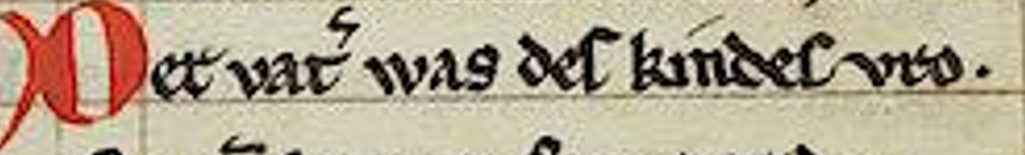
*Der vat(er) was deſ kindeſ vro.
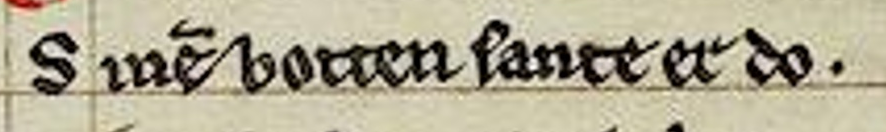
Sine(n) botten ſante er do.
